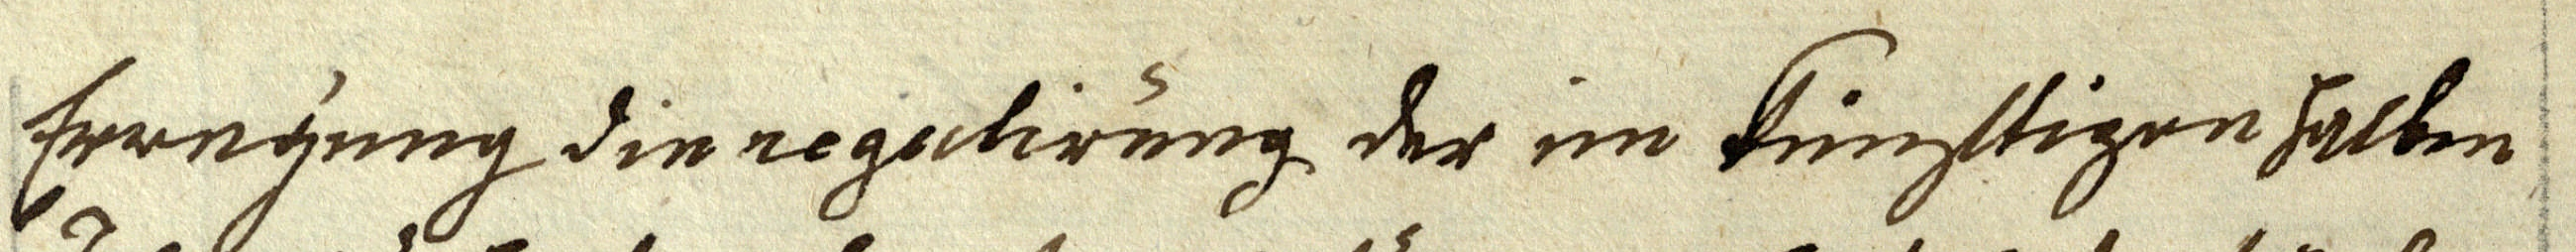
Erwegung die regulirung der im künftigen halben
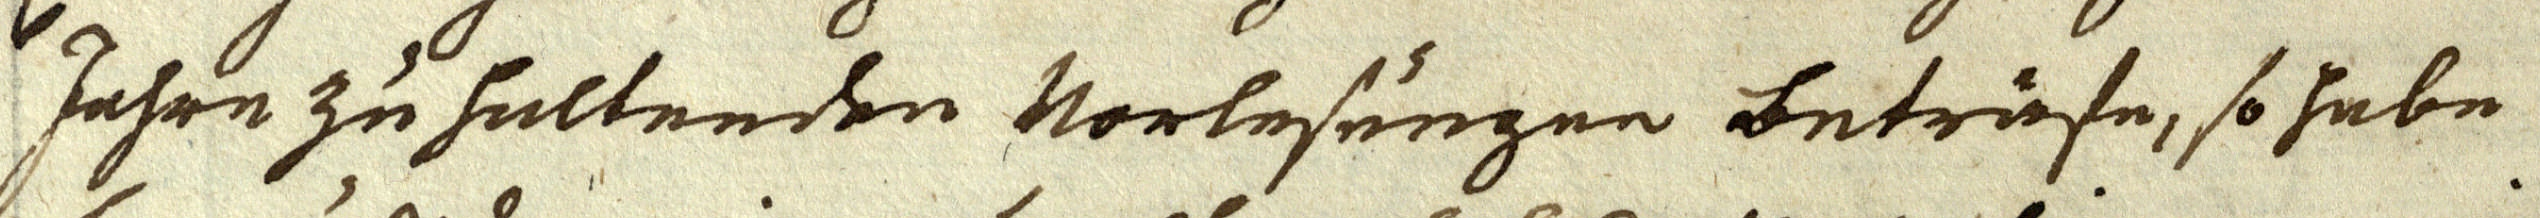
Jahre zu haltenden Vorlesungen beträfe, so habe
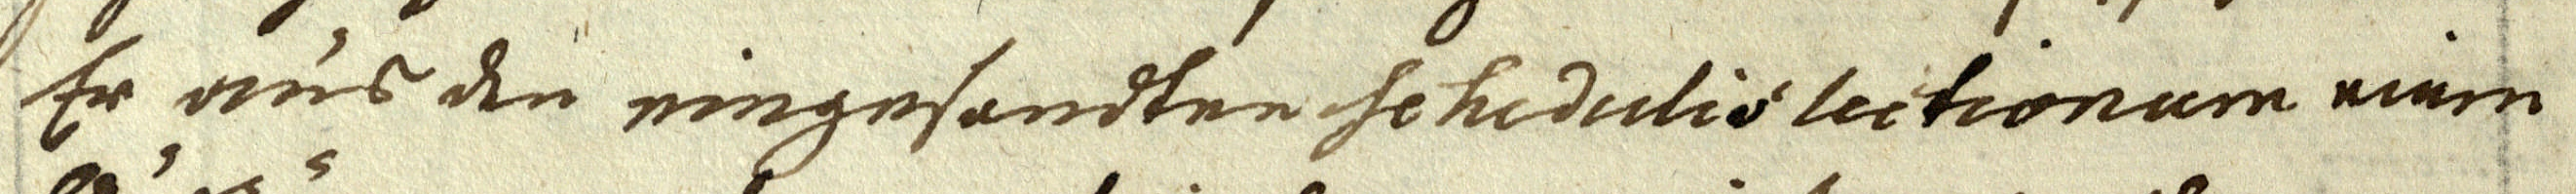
Er aus den eingesandten schedulis lectionum einen
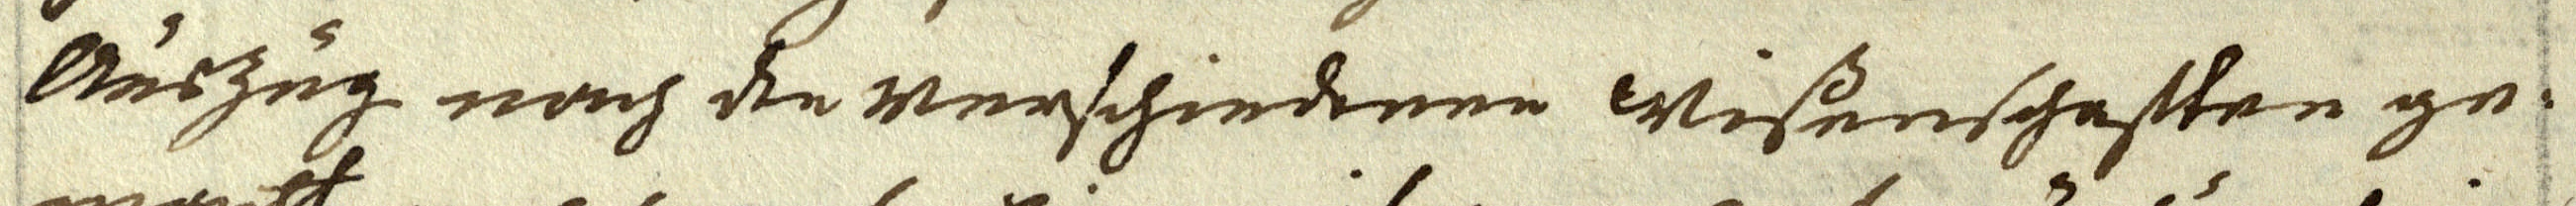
Auszug nach den verschiedenen Wissenschaften ge¬
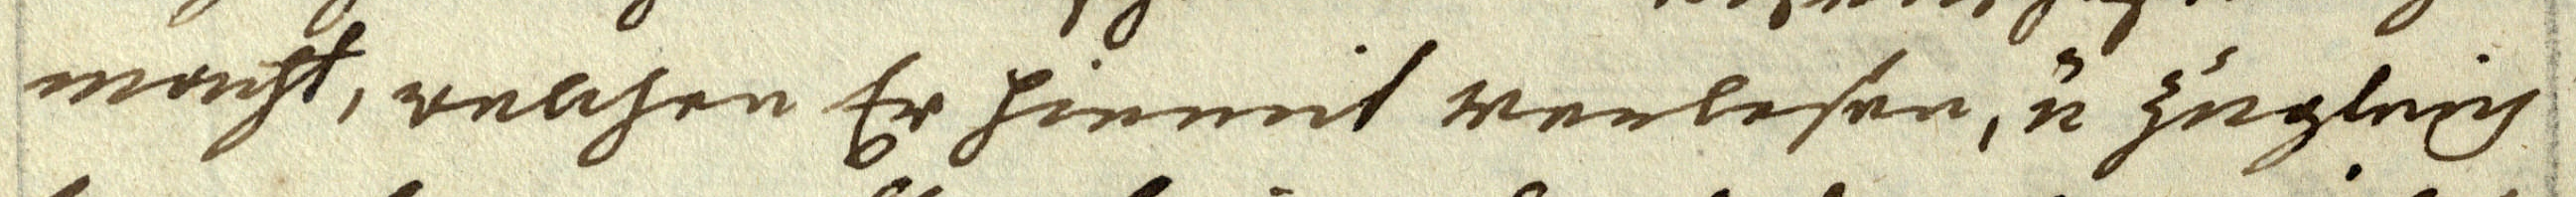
macht, welchen Er hiemit verlesen, u zugleich
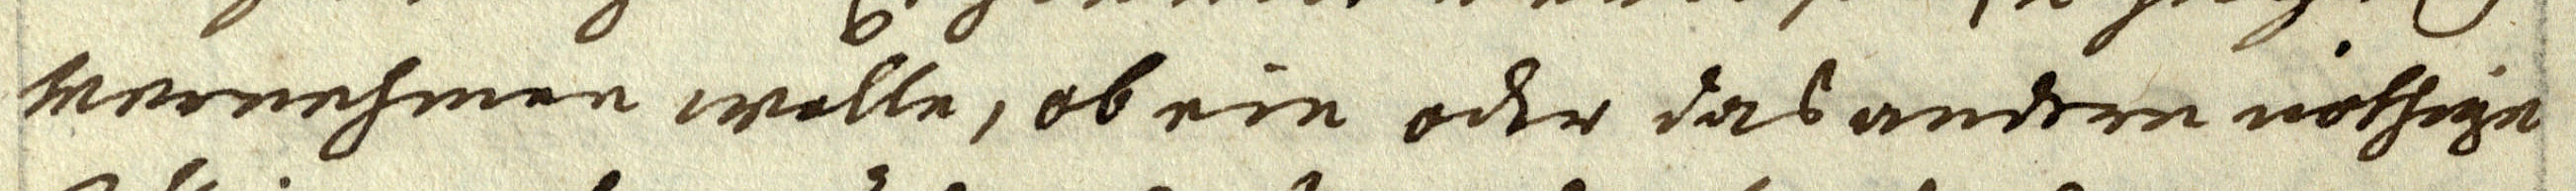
vernehmen wolle, ob ein oder das andere nöthige
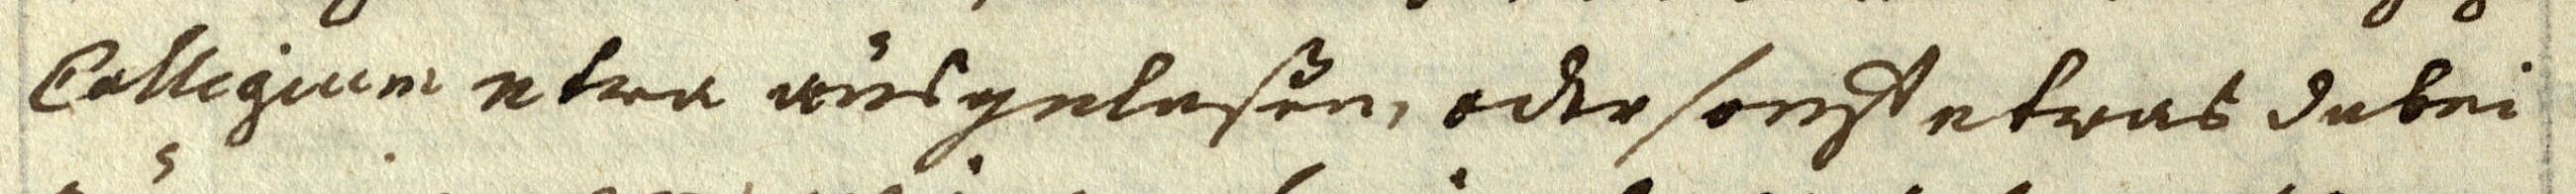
Collegium etwa ausgelaßen, oder sonst etwas dabei
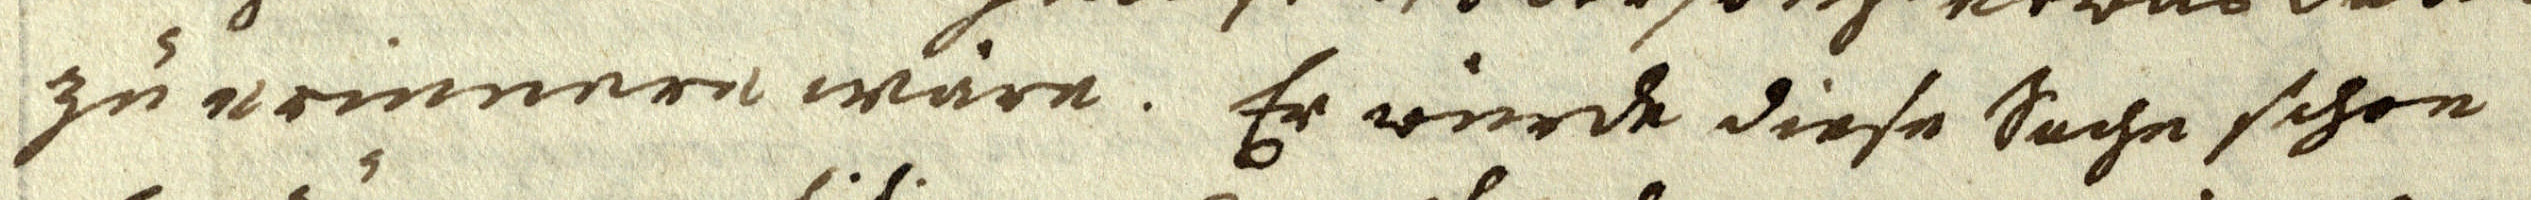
zu erinnern wäre. Er würde diese Sache schon
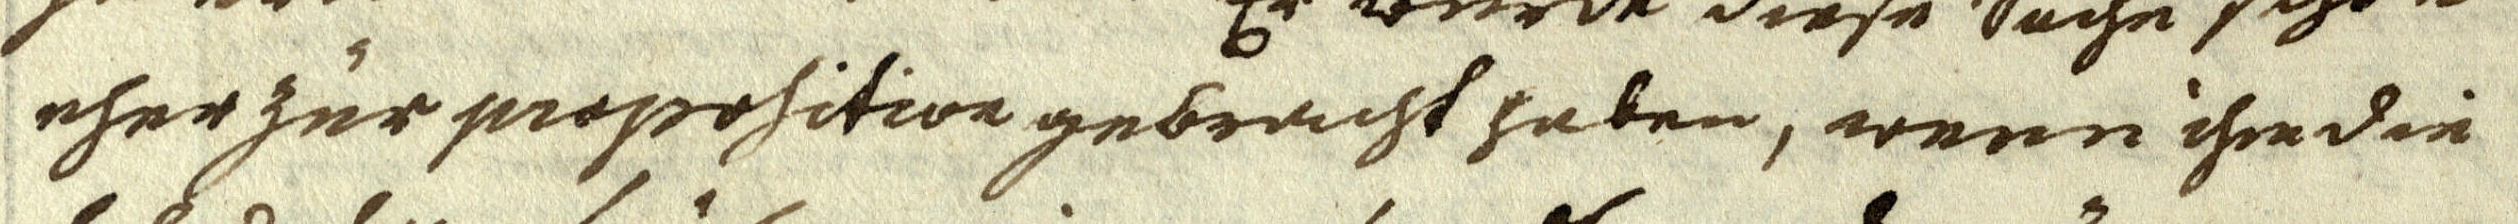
eher zur proposition gebracht haben, wenn ihm die
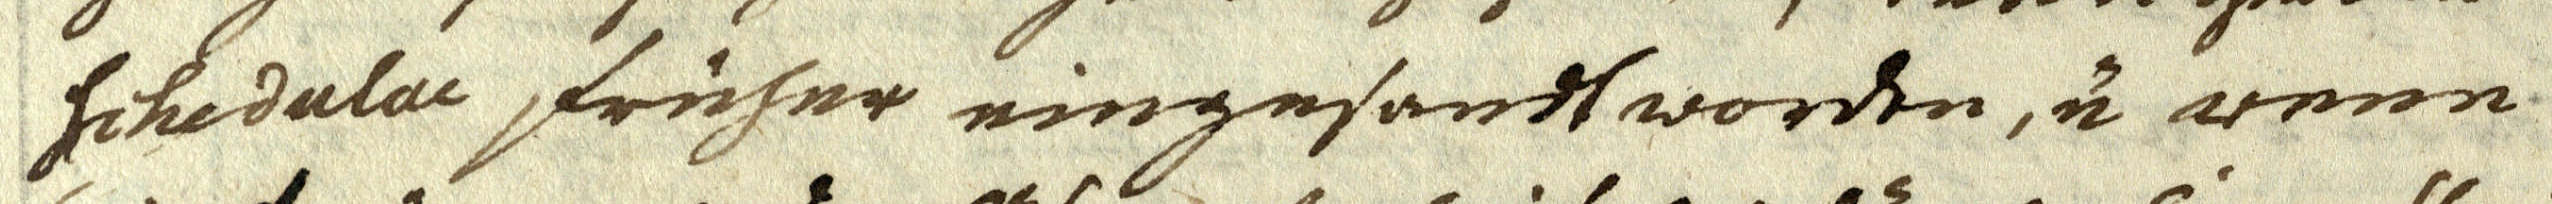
Schedulae früher eingesandt worden, u wenn
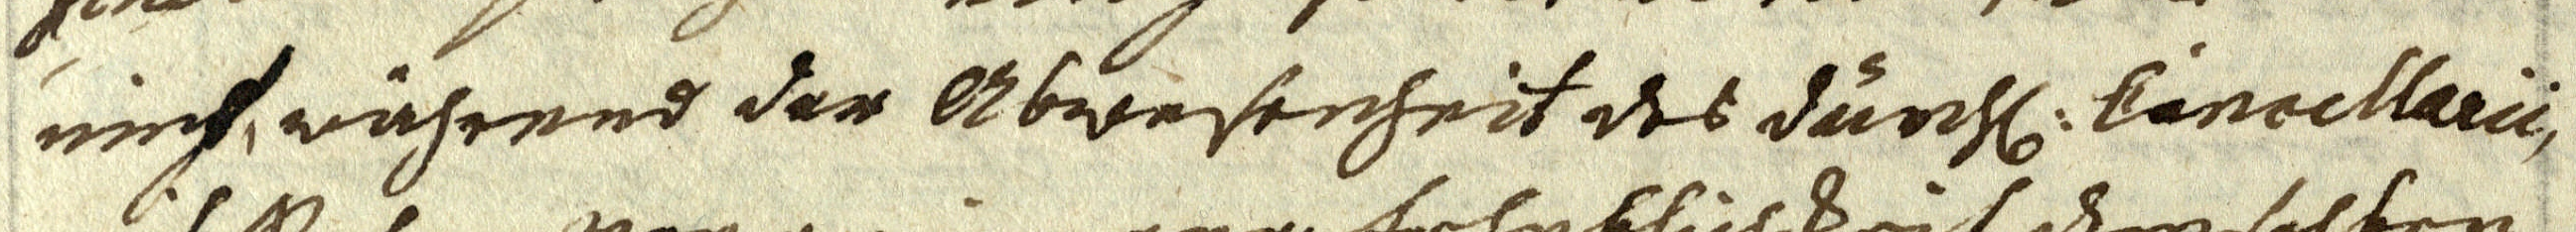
nicht, während den Abwesenheit des durchl. Cancellarii
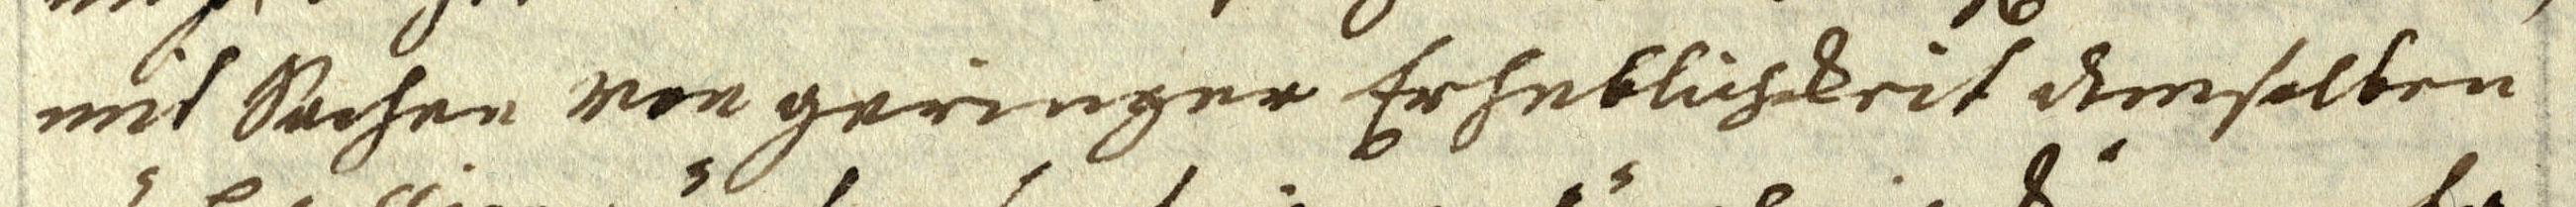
mit Sachen von geringer Erheblichkeit demselben
